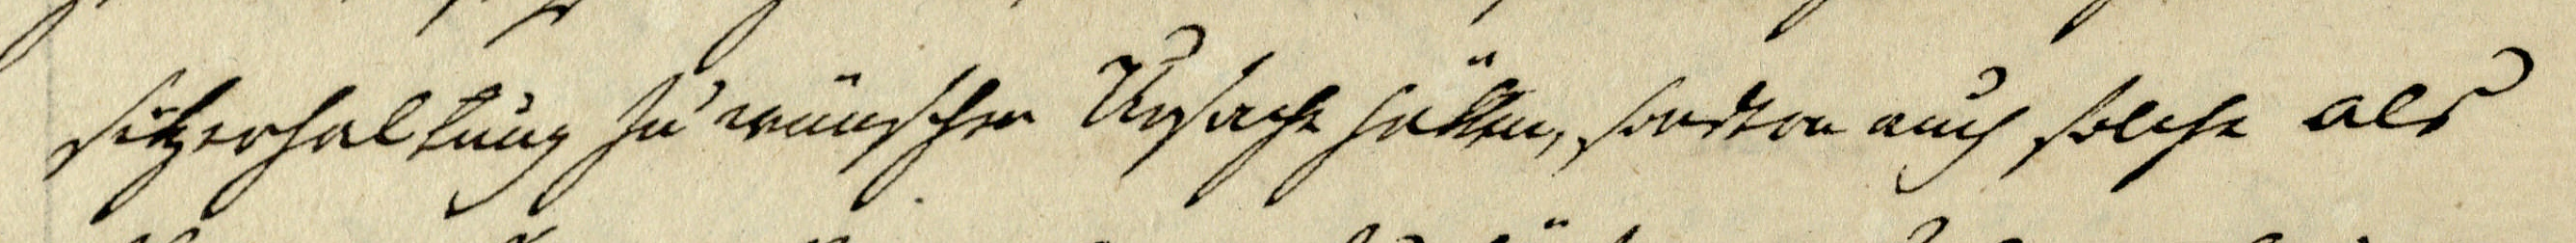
sitzerhaltung zu wünschen Ursache hätten, sondern auch solche als
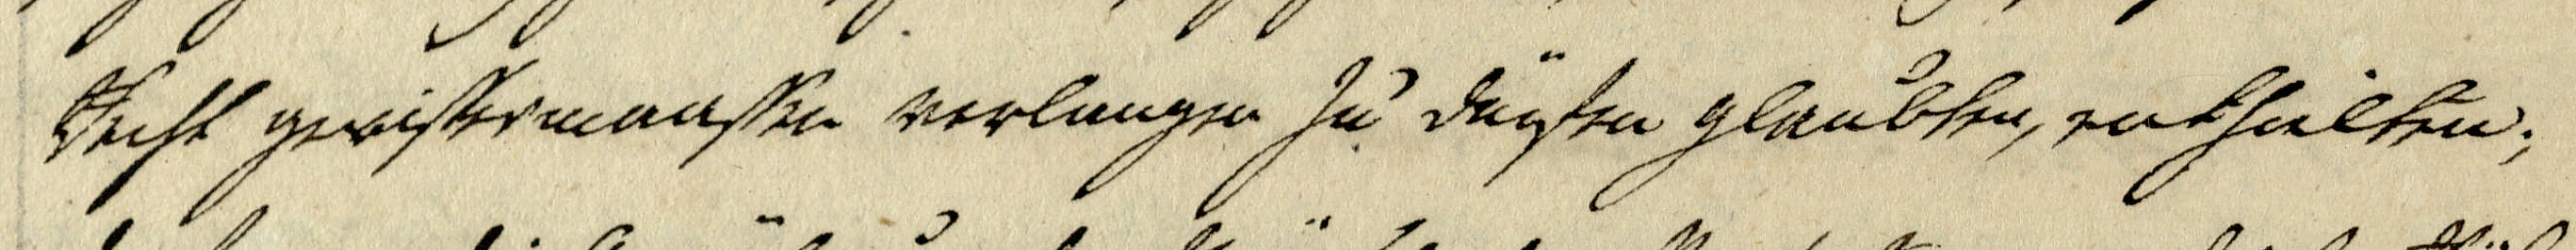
Recht gewissermaassen verlangen zu dürfen glaubten, enthielten;
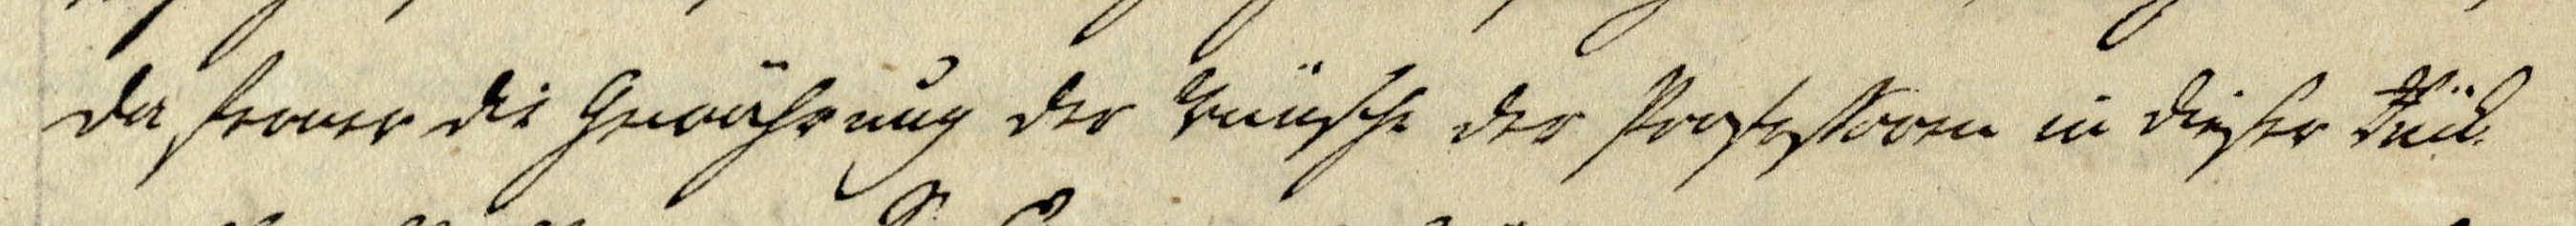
da ferner die Gewährung der Wünsche der Professoren in dieser Rück¬
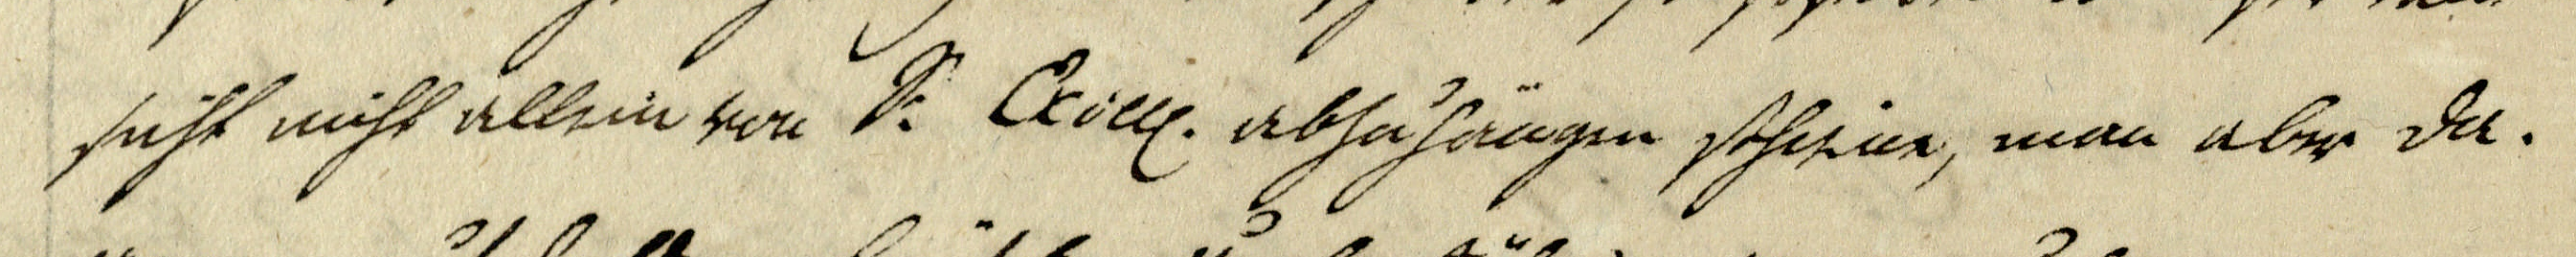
sicht nicht allein von Sr. Excell. abzuhängen schiene, man aber da¬
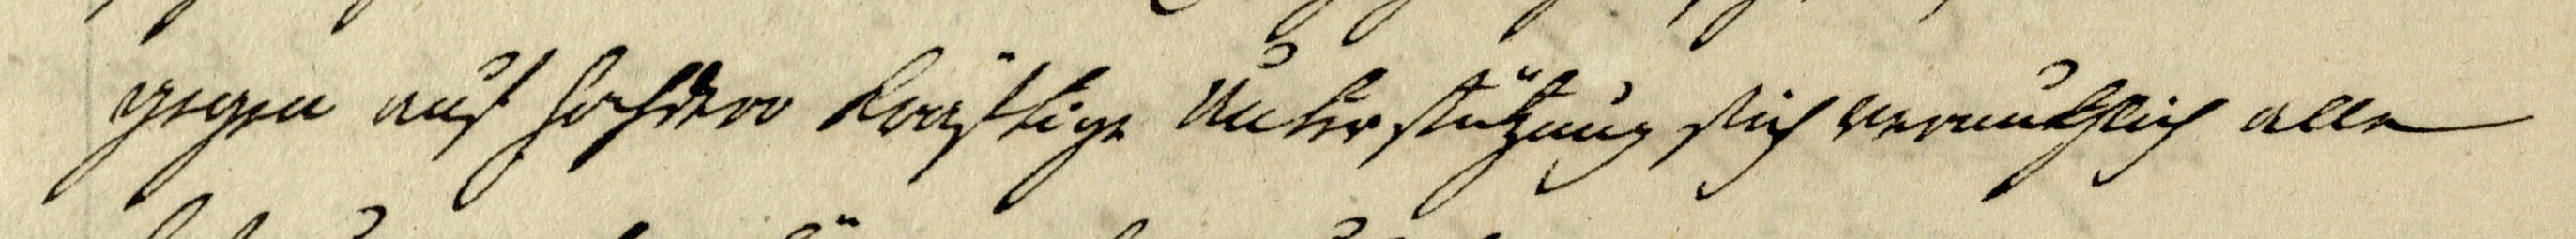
gegen auf hochdero kräftige Unterstützung sich vermuthlich alle
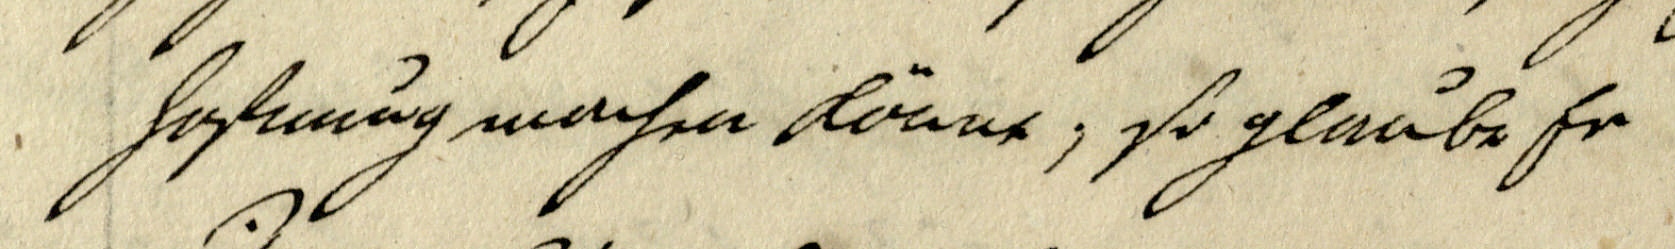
Hofnung machen könne, so glaube Er
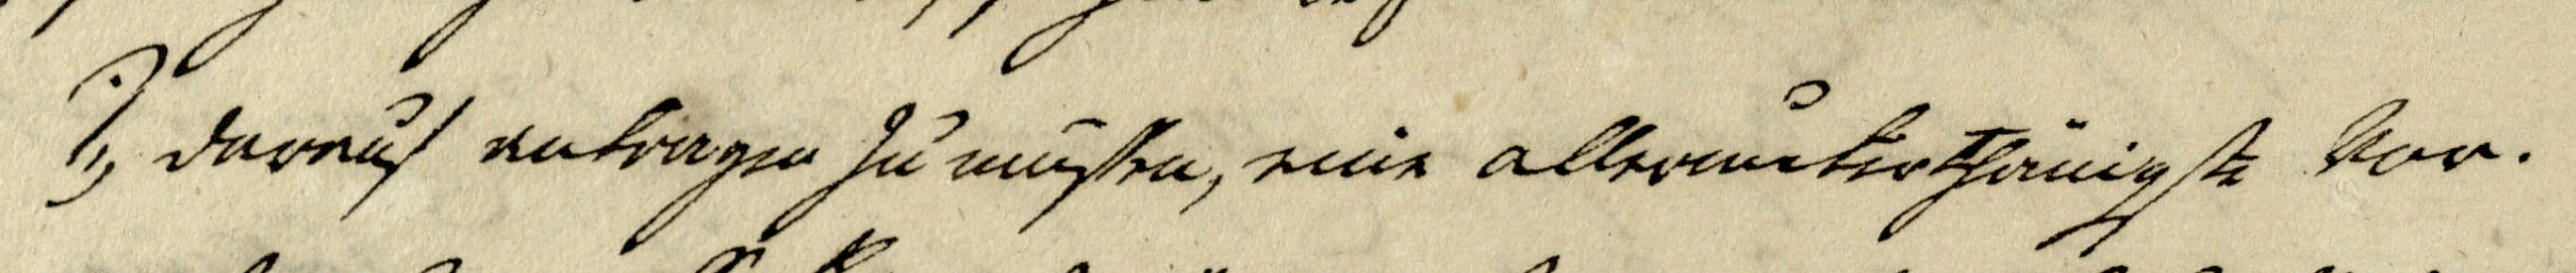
1., darauf antragen zu müssen, eine allerunterthänigste Vor¬
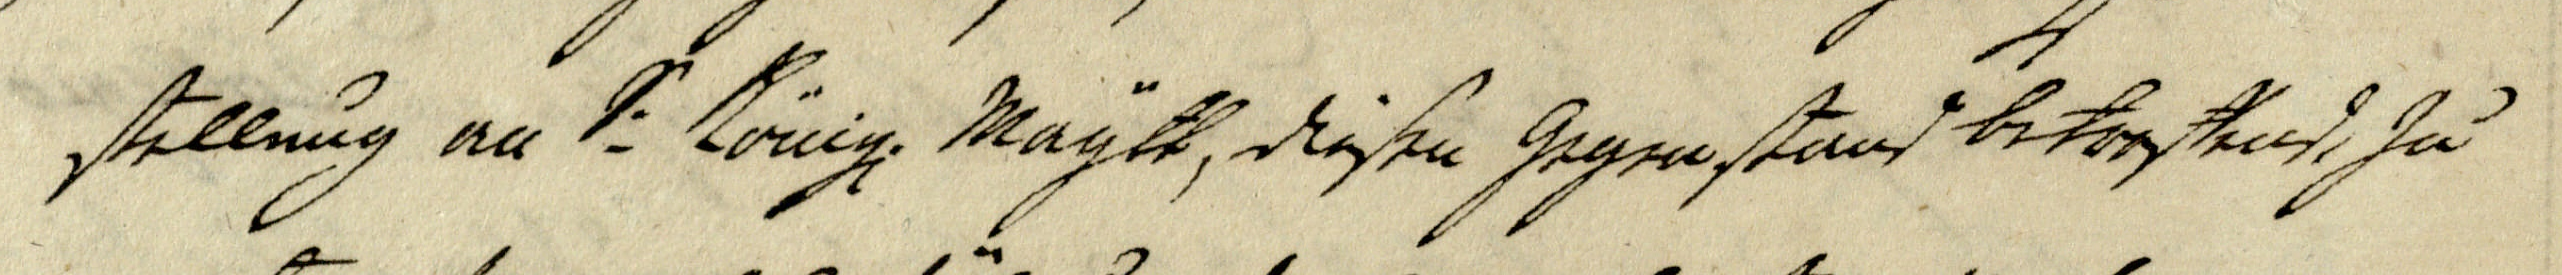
stellung an Sr. König. Maÿtt, diesen Gegenstand betreffend, zu
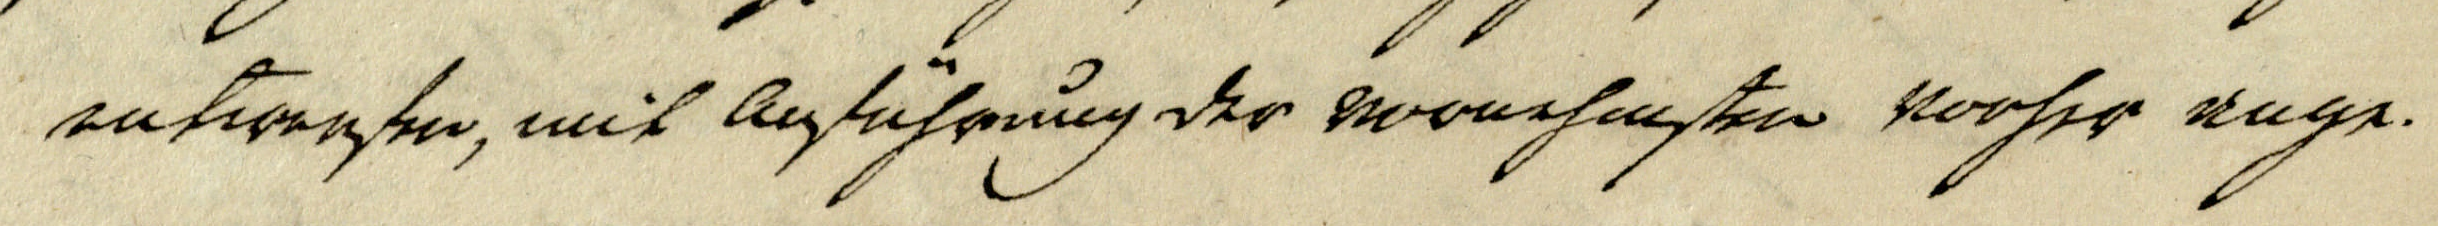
entwerfen, mit Anführung der vornehmsten vorher ange¬
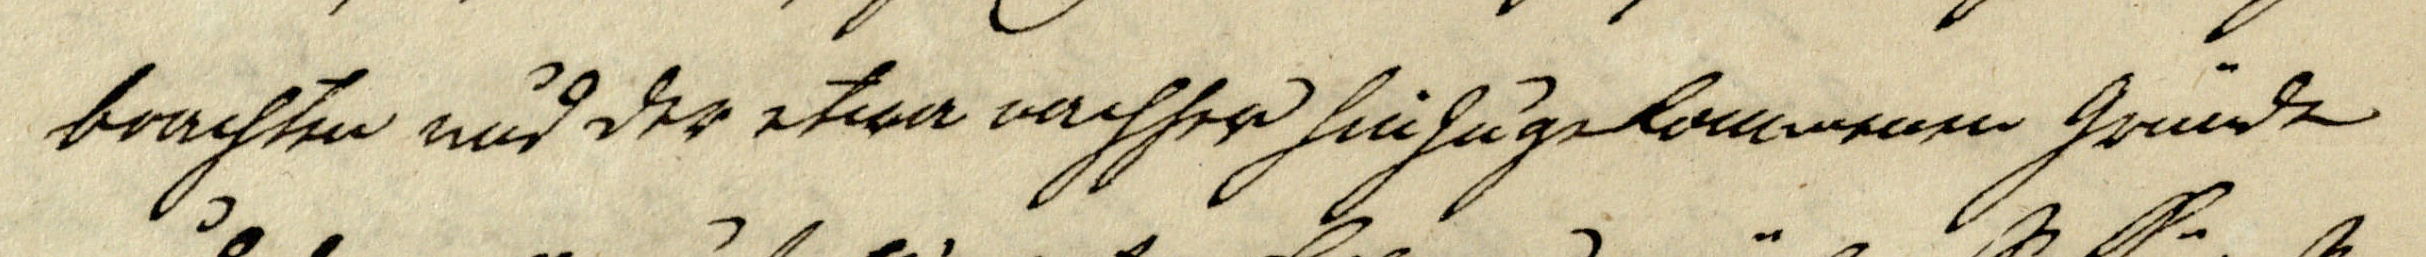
brachten und der etwa nachher hinzugekommenen Gründe
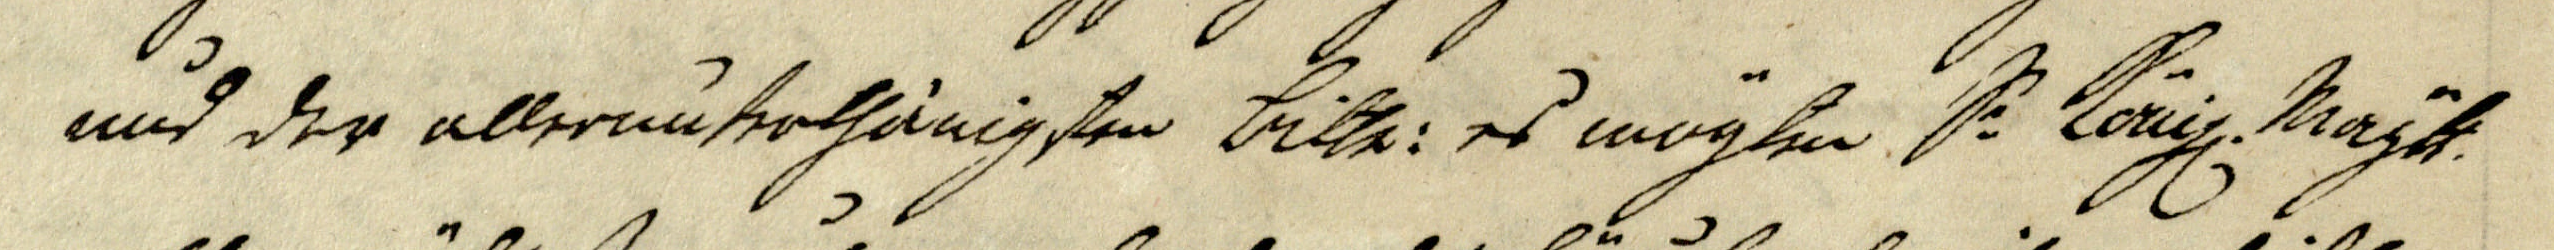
und der allerunterthänigsten Bitte: es mögten Sr. Königl. Maÿtt
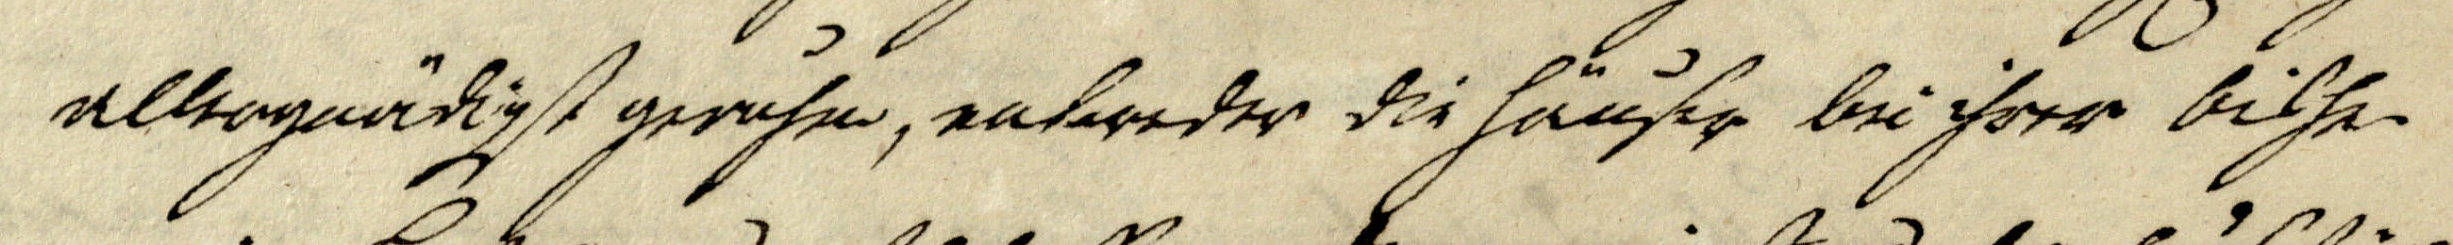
allergnädigst geruhen, entweder die Häuser bei ihrer bishe¬
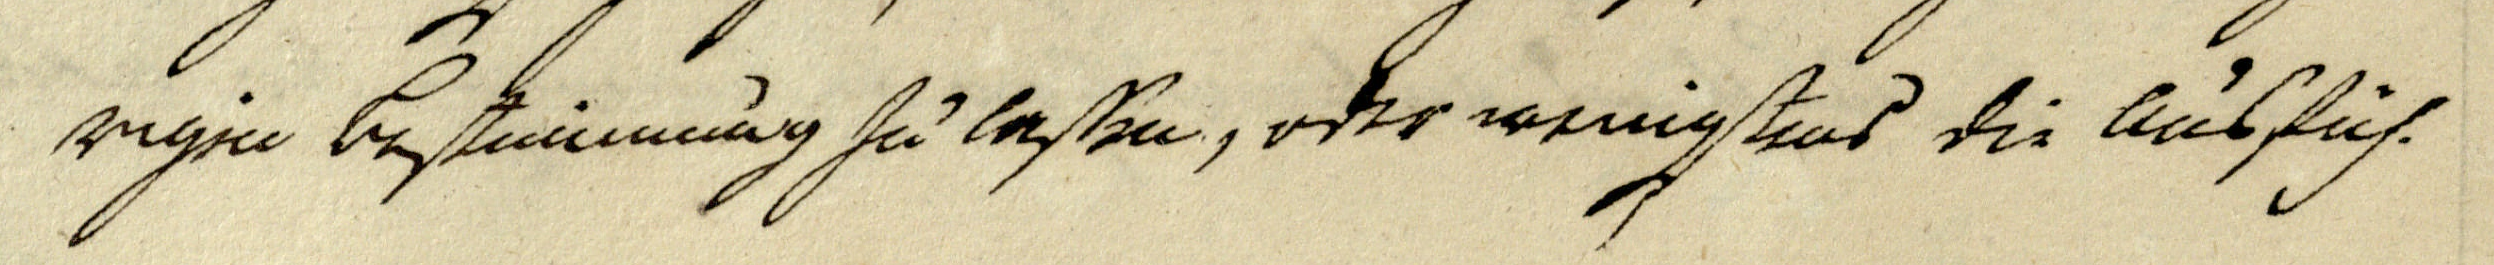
rigen Bestimmung zu lassen, oder wenigstens die Ausfüh¬
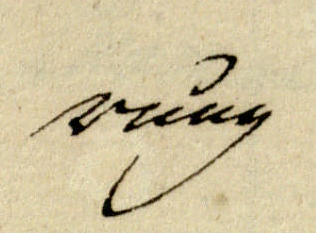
rung
